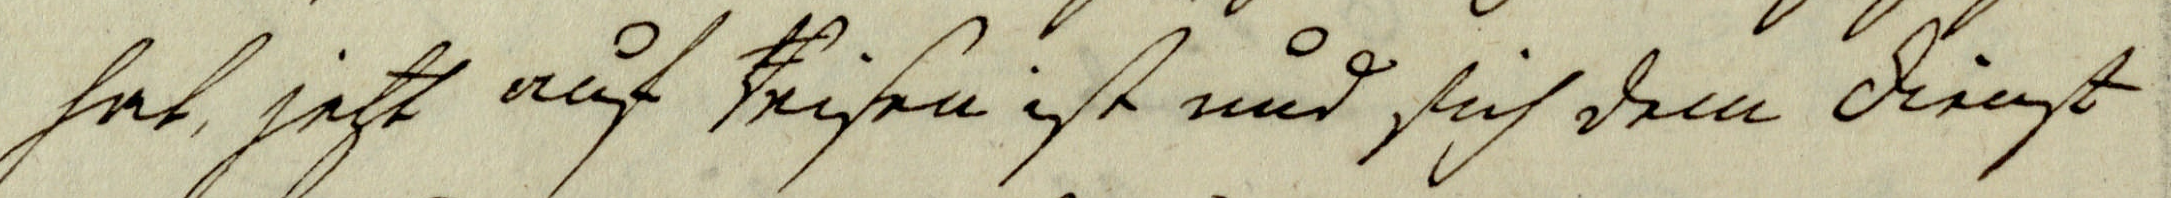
hat, jetzt auf Reisen ist und sich dem Dienst
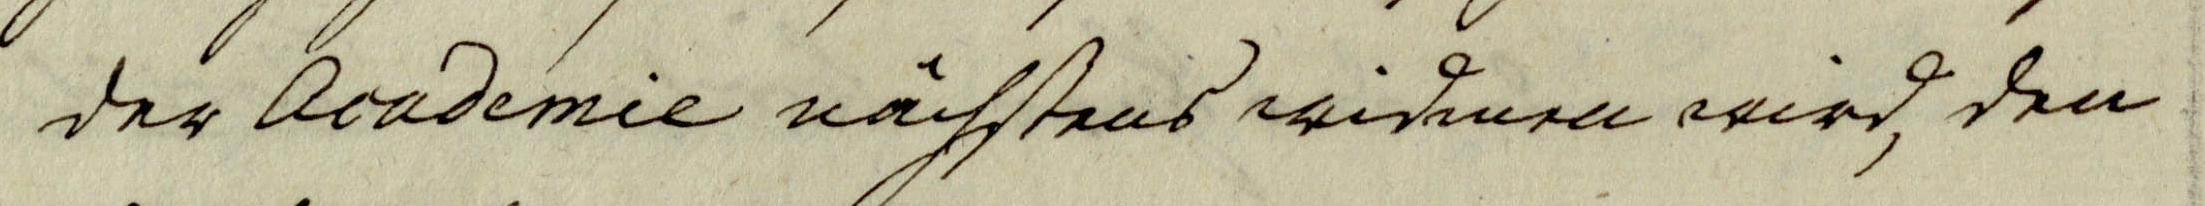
der Academie nächstens widmen wird, den
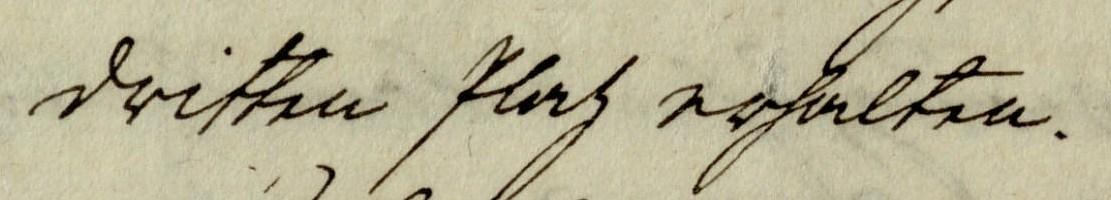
dritten Platz erhalten.
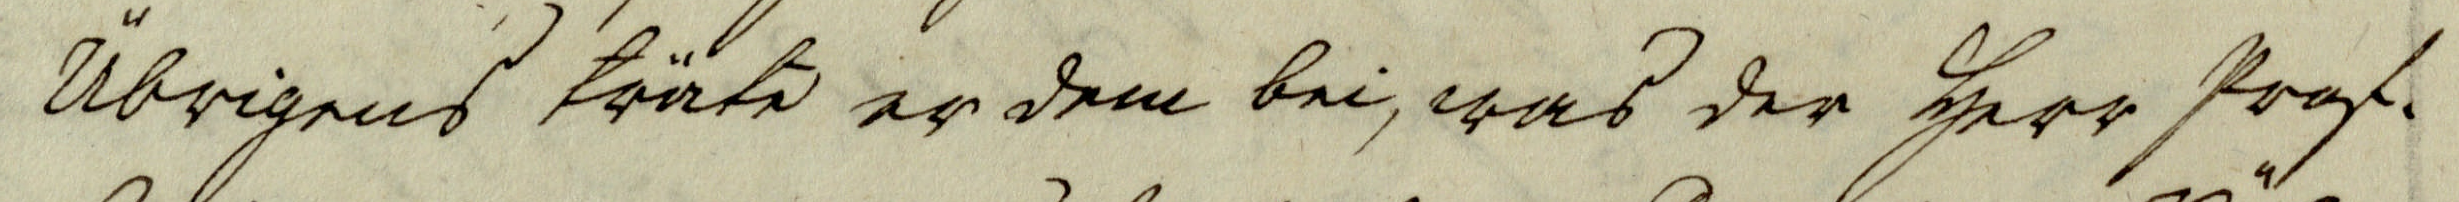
Übrigens träte er dem bei, was der Herr Prof.
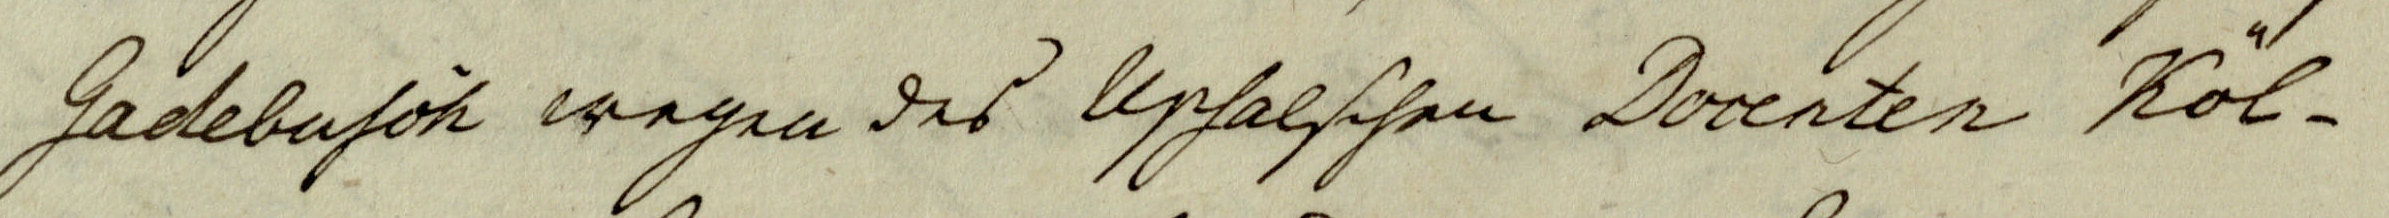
Gadebusch wegen des Upsalschen Docenten Köl¬
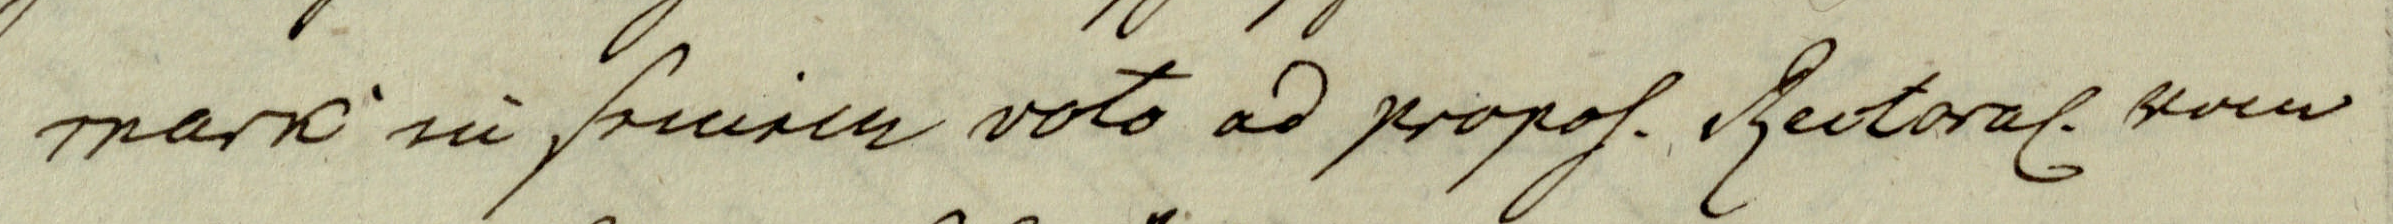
mark in seinem voto ad propos. Rectoral. vom
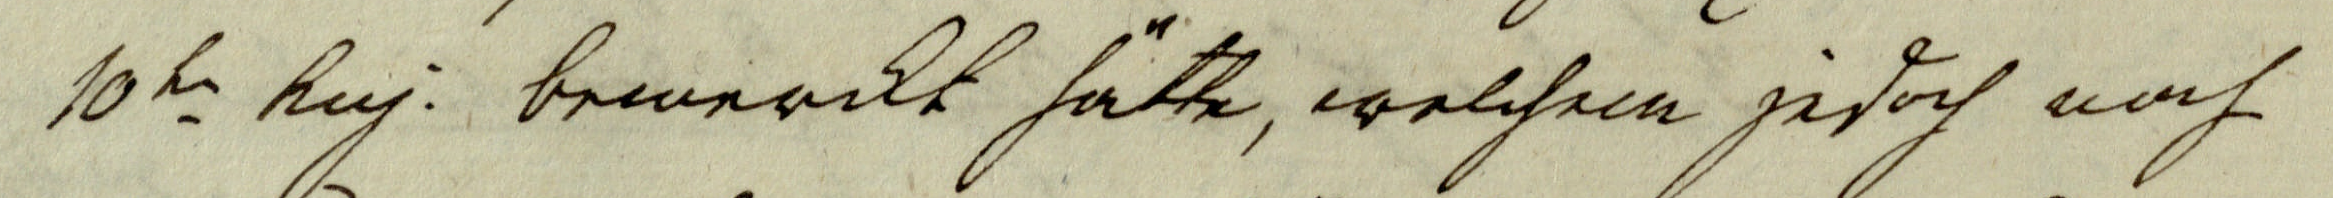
10t. huj. bemerckt hätte, welchem jedoch noch
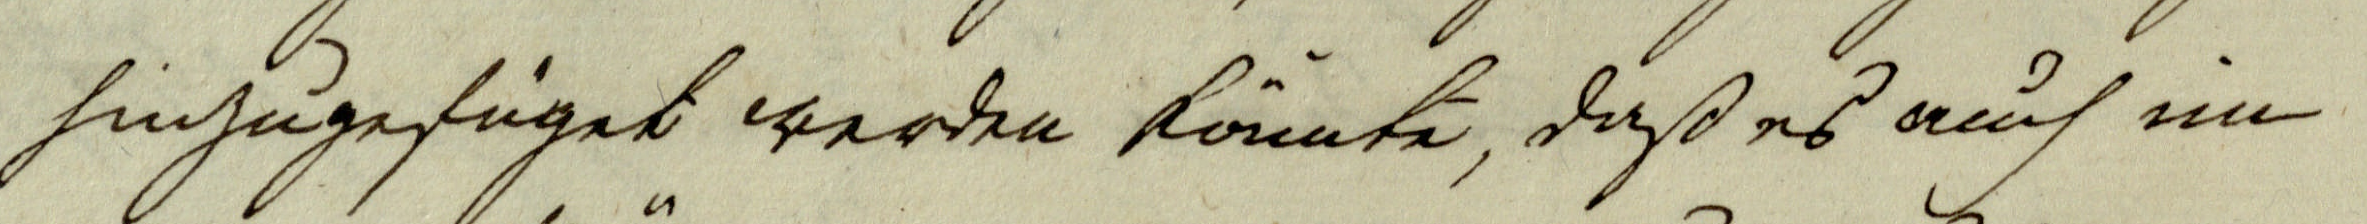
hinzugefügt werden könnte, daß es auch im
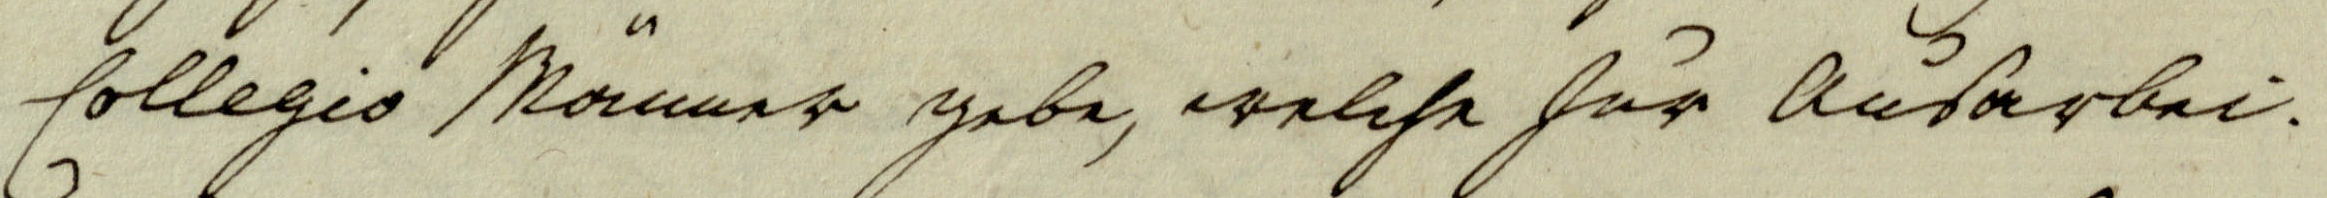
Collegio Männer gebe, welche zur Ausarbei¬
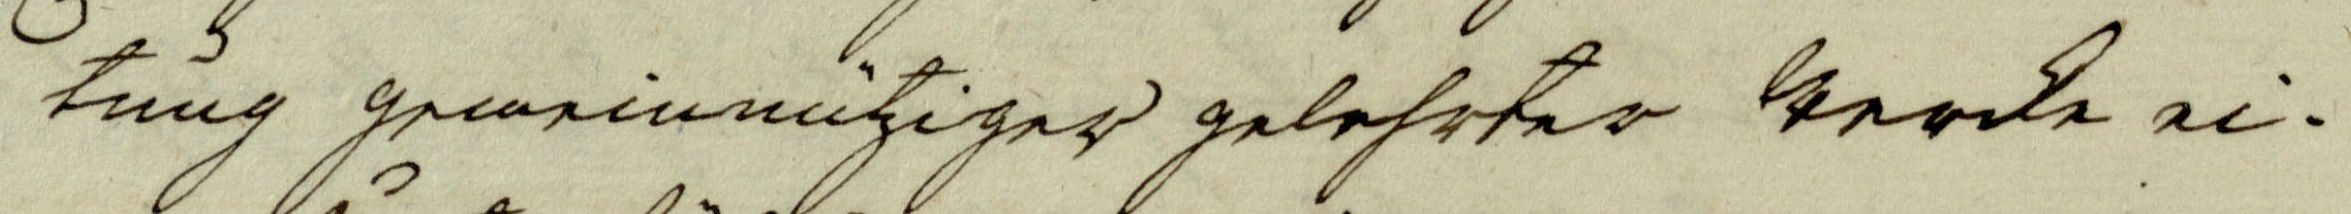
tung gemeinnütziger gelehrter Wercke ei¬
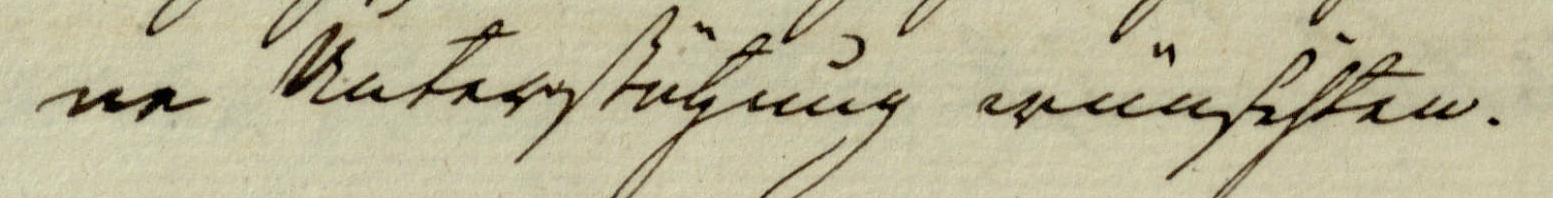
ne Unterstützung wünschten.
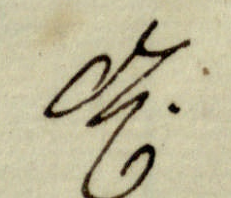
dh.
